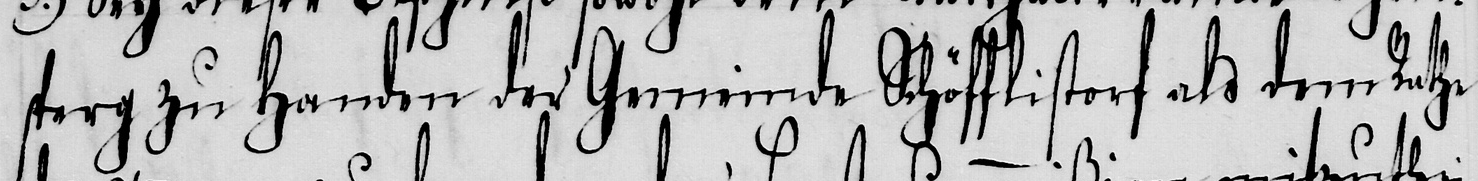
sperg zu Handen der Gemeinde Schöfflistorf als
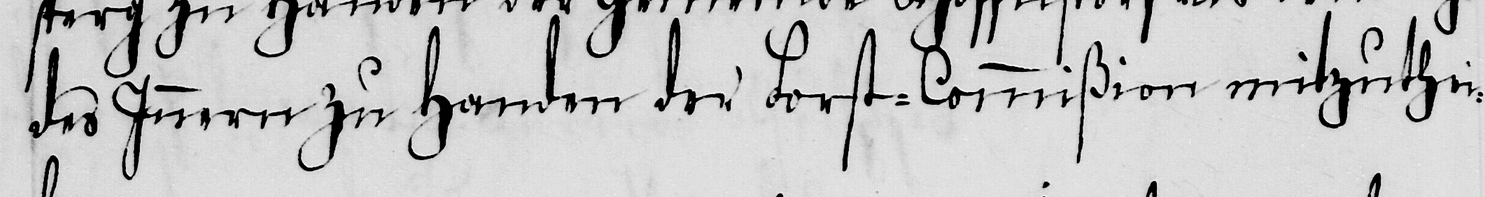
des Innern zu Handen der Forst-Commißion mitzuthei¬
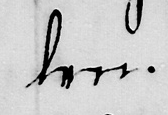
len.
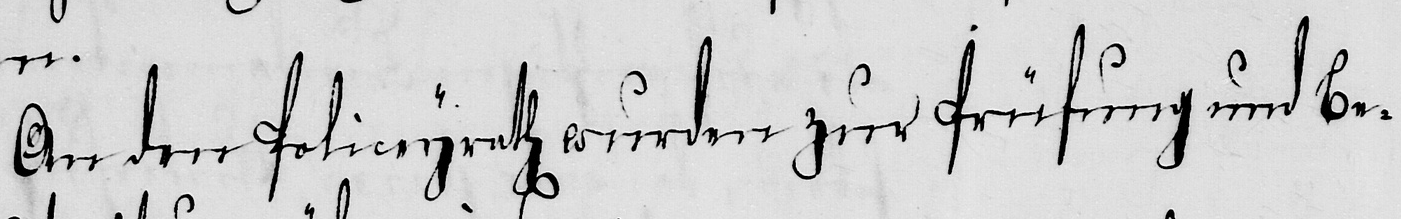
An den Policeyrath wurden zur Prüfung und Be¬
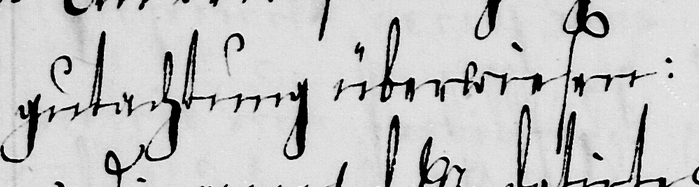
gutachtung überwiesen:
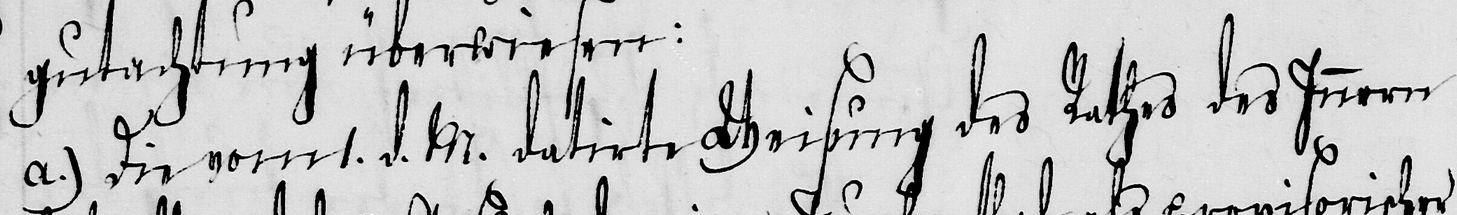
a.) Die vom 1. d. M. datirte Weisung des Rathes des Innern
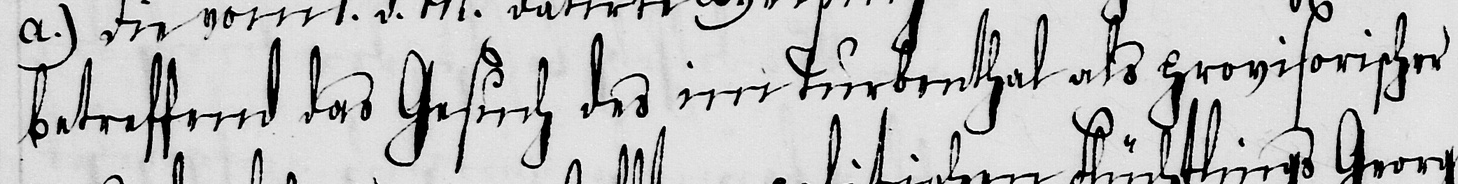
betreffend das Gesuch des im Turbenthal als provisorischer
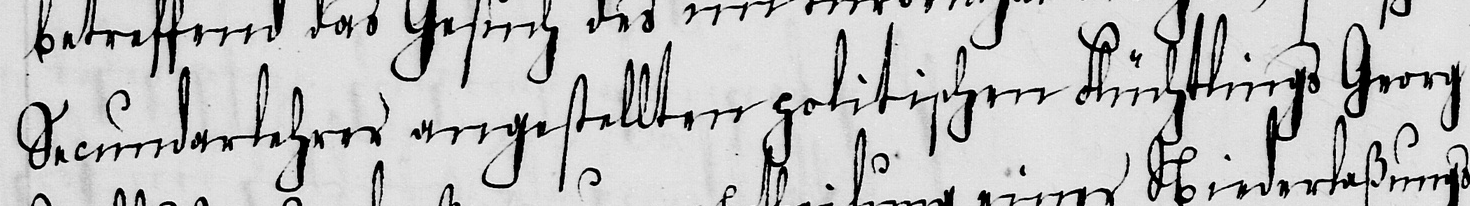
Secundarlehrer angestellten politischen Flüchtlings Georg
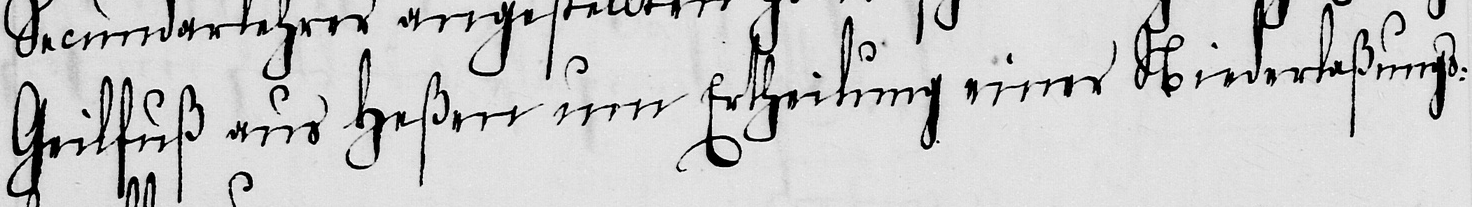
Geilfuß aus Heßen um Ertheilung einer Niederlaßungs¬
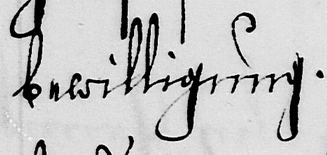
bewilligung.
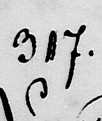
3.)
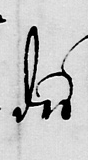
dem
